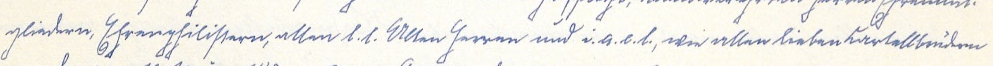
gliedern, Ehrenphilistern, allen l. l. Alten Herren und i. a. b. l., wie allen lieben Cartellbrüdern
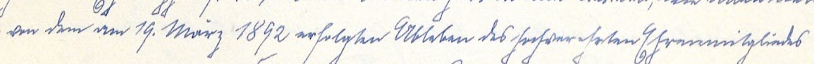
von dem am 19. März 1892 erfolgten Ableben des hochverehrten Ehrenmitglieds
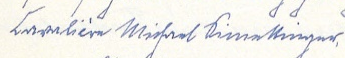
Carolier Michael Simettinger,
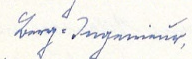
Berg-Ingenieur.
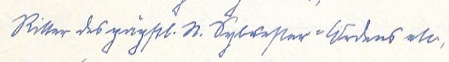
Ritter des XXX St. XXX-Ordens XXX,
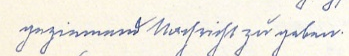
geziemend Nachricht zu geben.
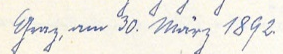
Graz, am 30. März 1892.
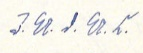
I. A. d. A. C.
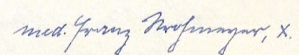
med. Franz Strohmeyer, X.
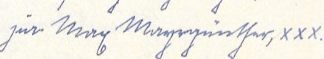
jur. Max XXX, XXX.
